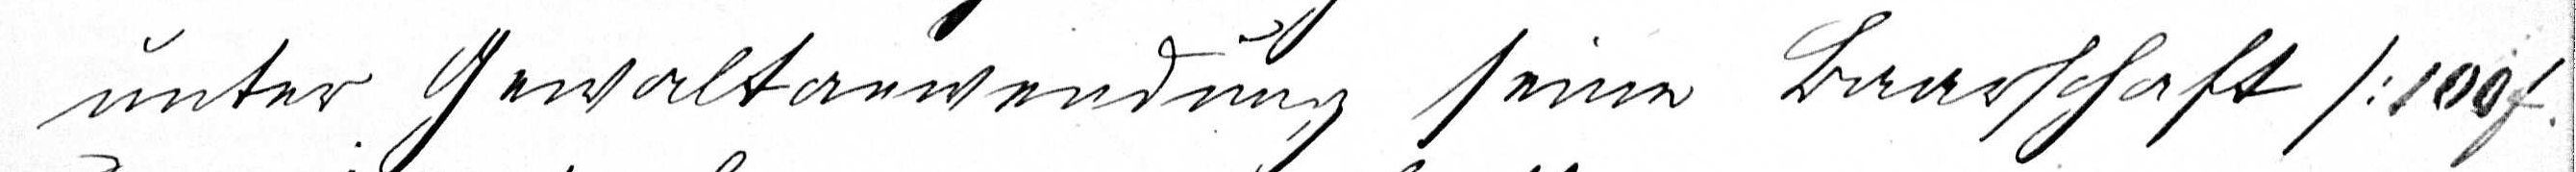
unter Gewaltanwendung seine Baarschaft (100f
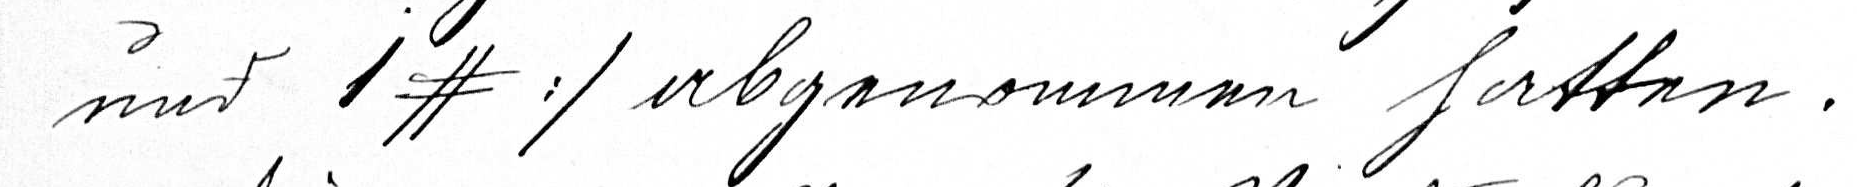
und 1#) abgenommen hatten.
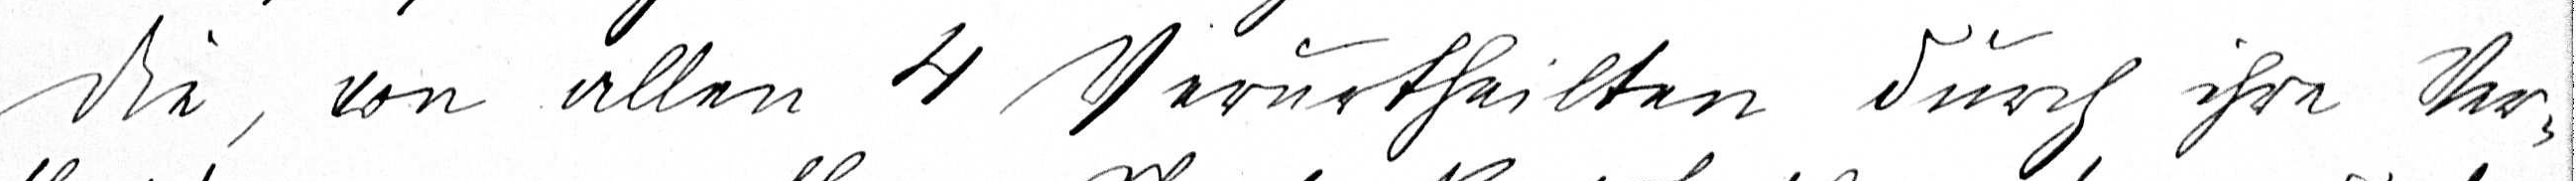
Die, von allen 4 Verurtheilten durch ihre Ver¬
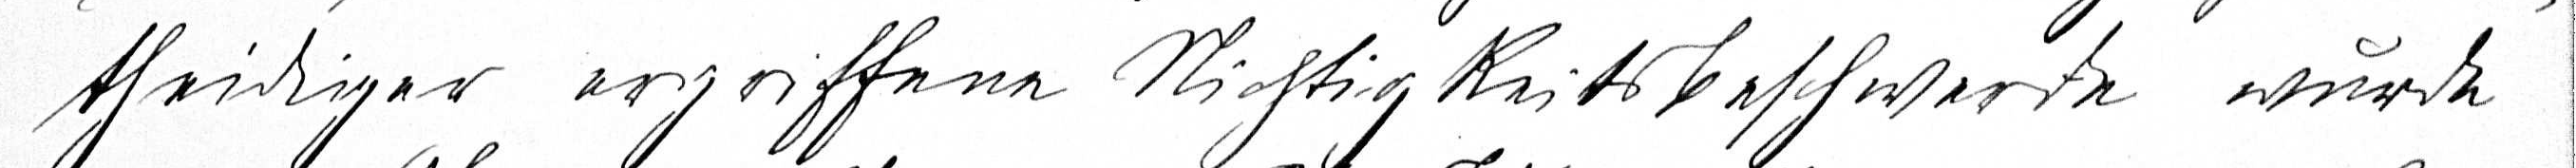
theidiger ergriffene Nichtigkeitsbeschwerde wurde
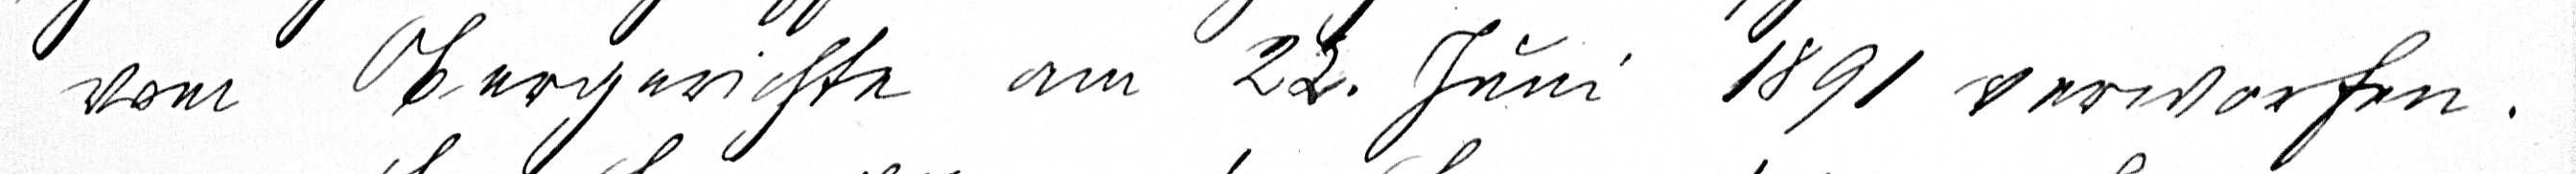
vom Obergerichte am 22. Juni 1891 verworfen.
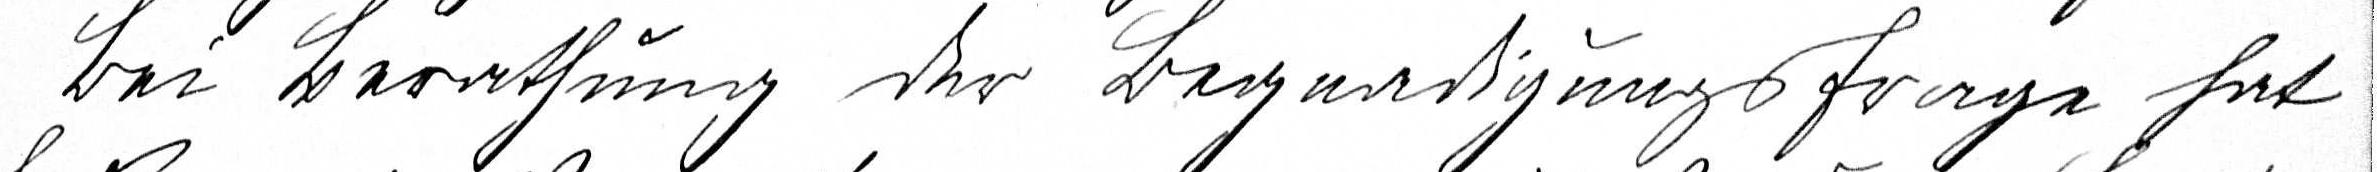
Bei Berathung der Begnadigungsfrage hat
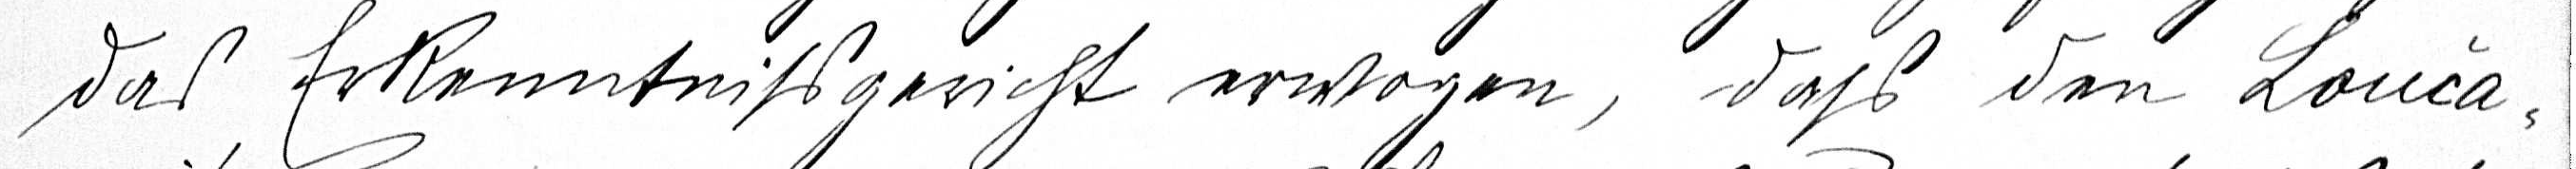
das Erkenntnißgericht erwogen, daß den Louča¬
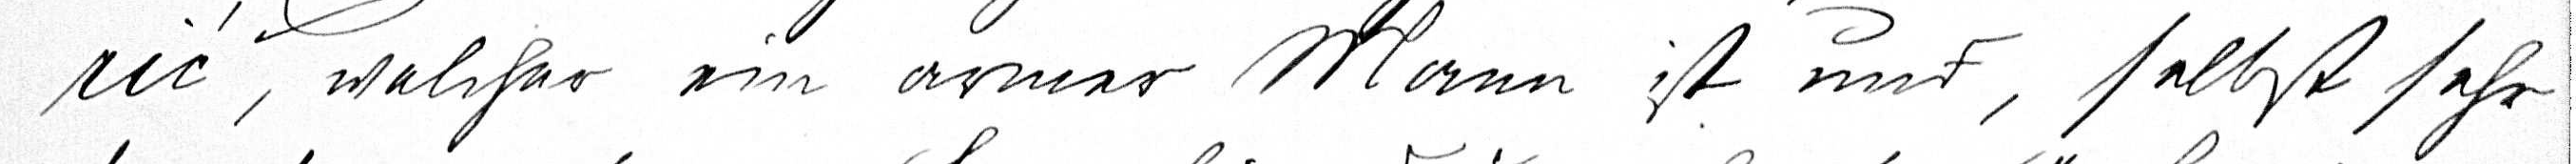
rić, welcher ein armer Mann ist und, selbst sehr
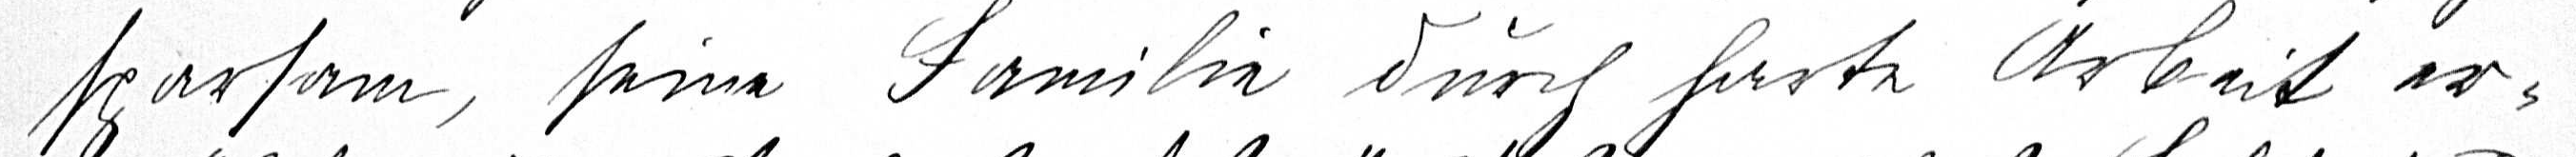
sparsam, seine Familie durch harte Arbeit er¬
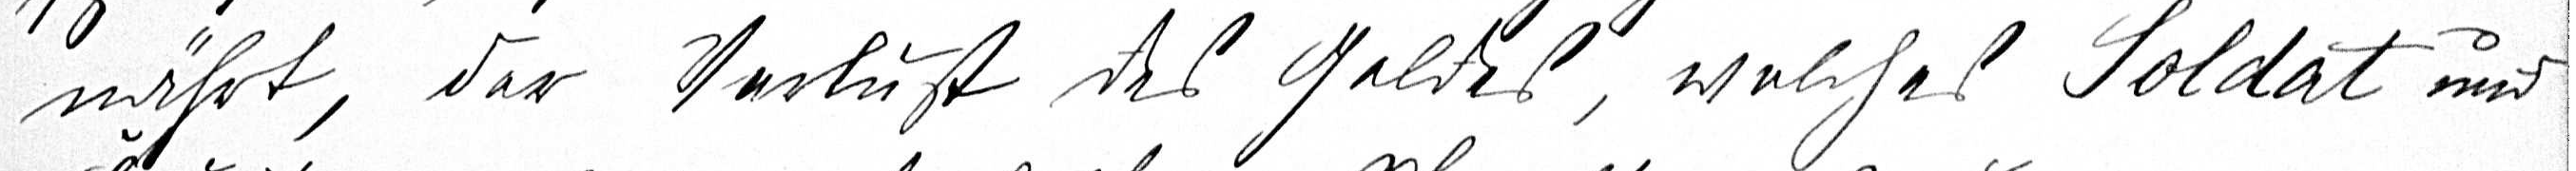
nährt, der Verlust des Geldes, welches Soldat und
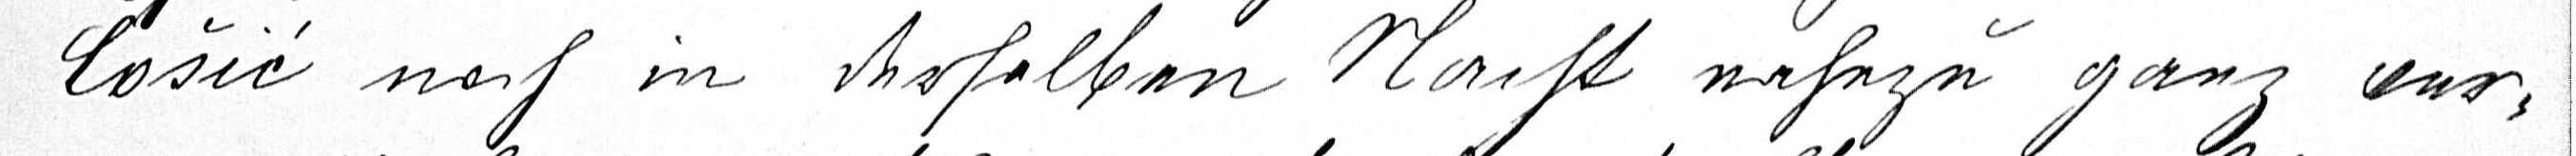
Čošić noch in derselben Nacht nahezu ganz ver¬
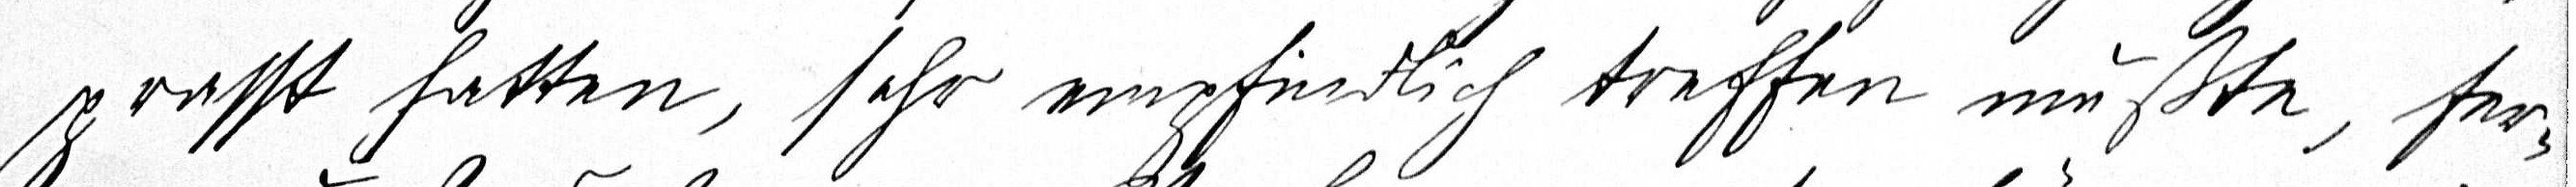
prasst hatten, sehr empfindlich treffen mußte, fer¬
